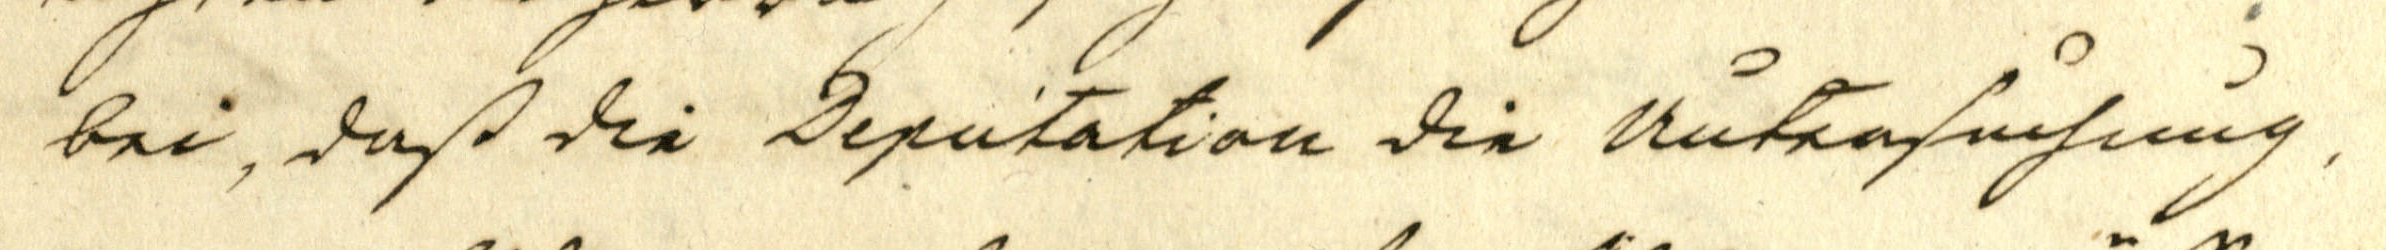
bei, daß die Deputation die Untersuchung
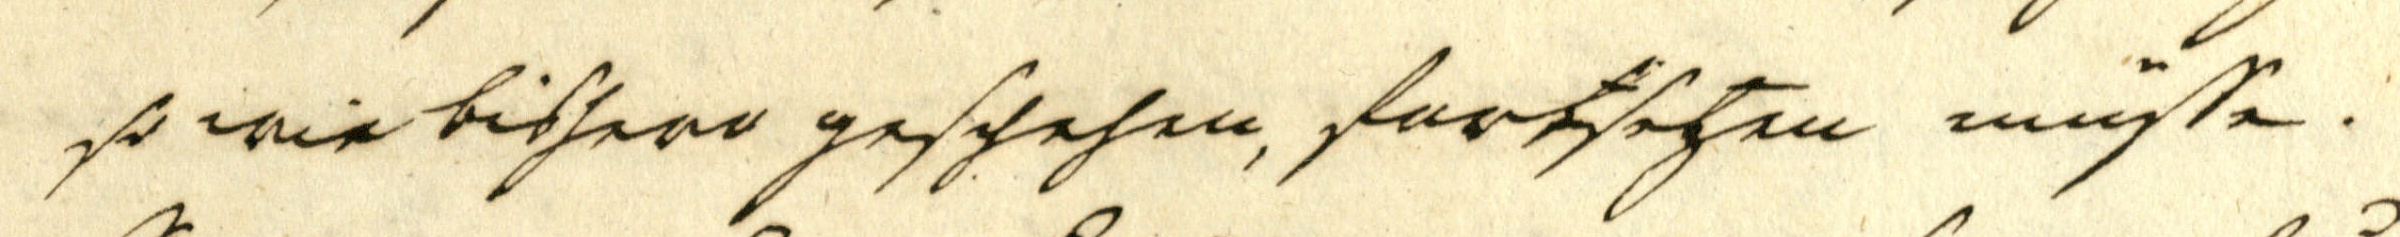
so wie bishero geschehen, fortsetzen müsse.
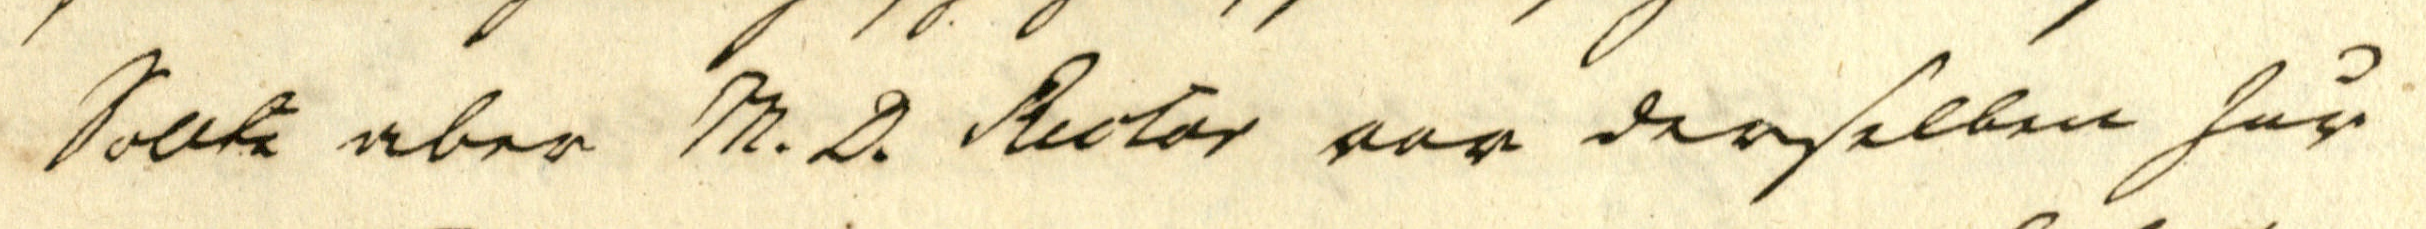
Sollte aber M. D. Rector vor derselben zur
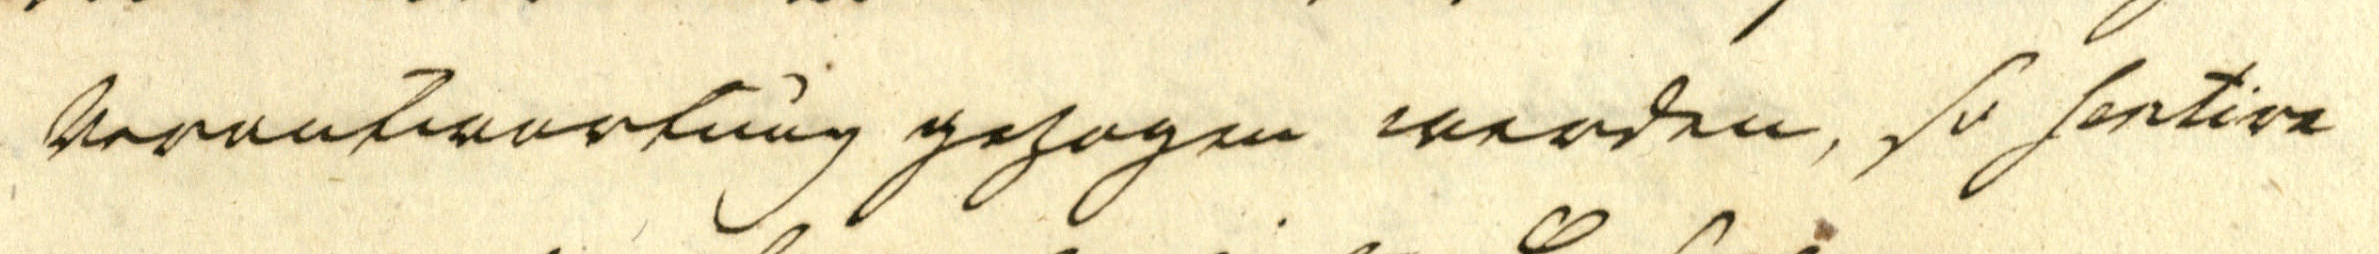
Verantwortung gezogen werden, so sentire
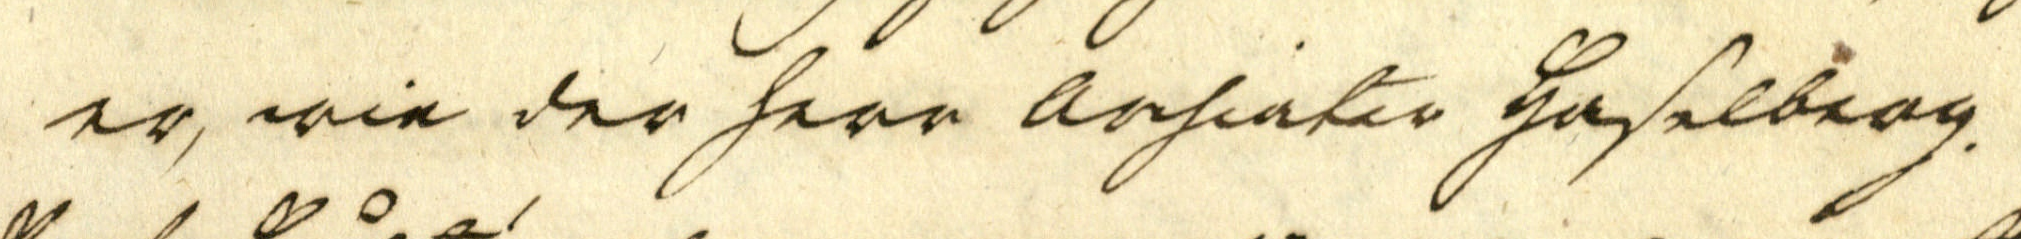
er, wie der Herr Archiater Haselberg.
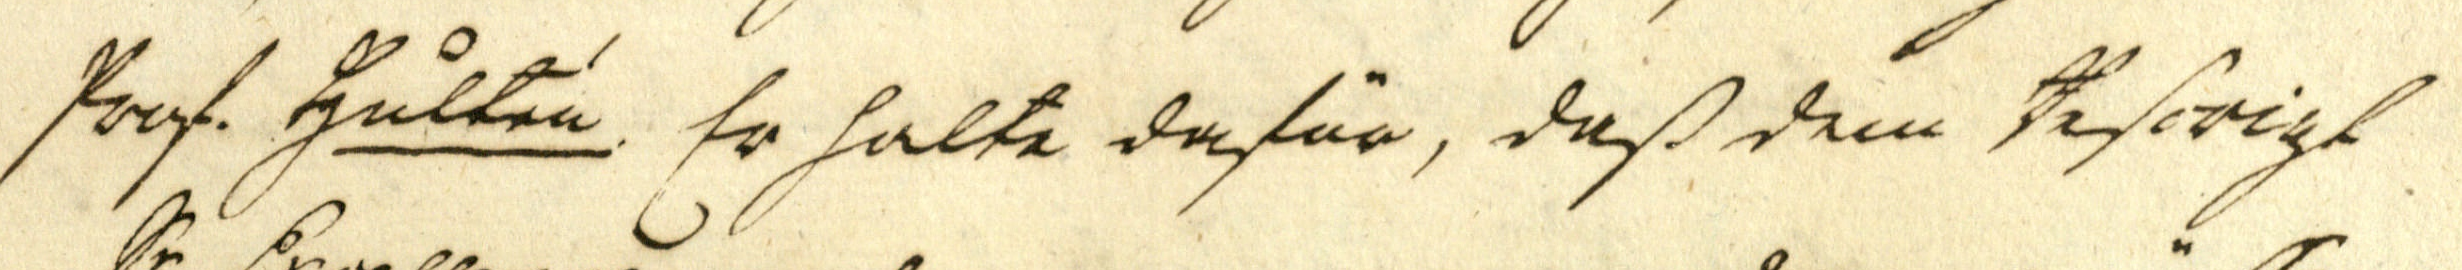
Prof. Hultén. Er halte dafür, daß dem Rescript
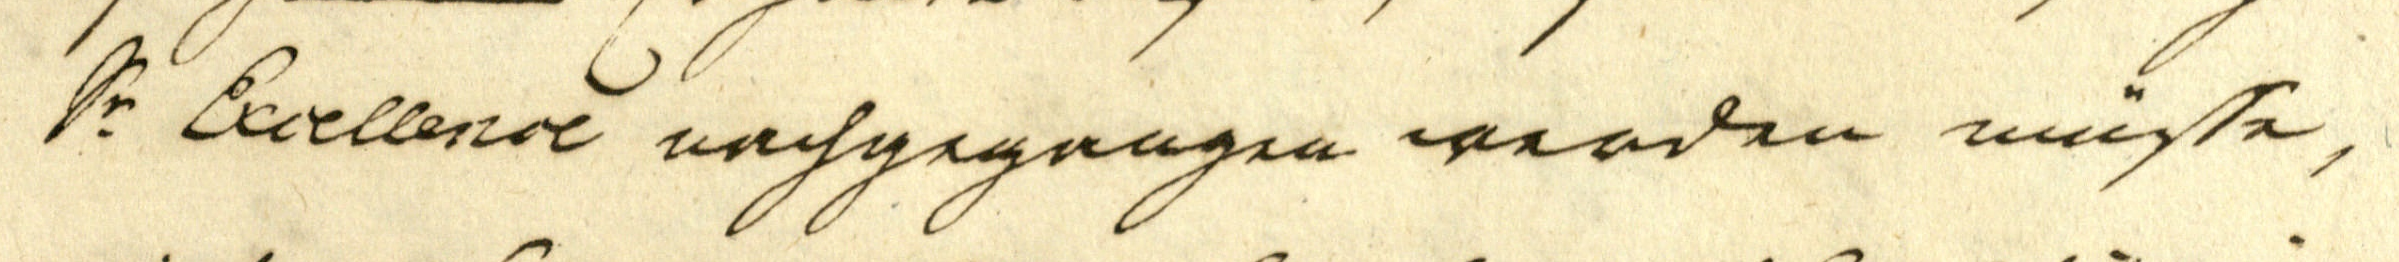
Sr Excellence nachgegangen werden müsse,
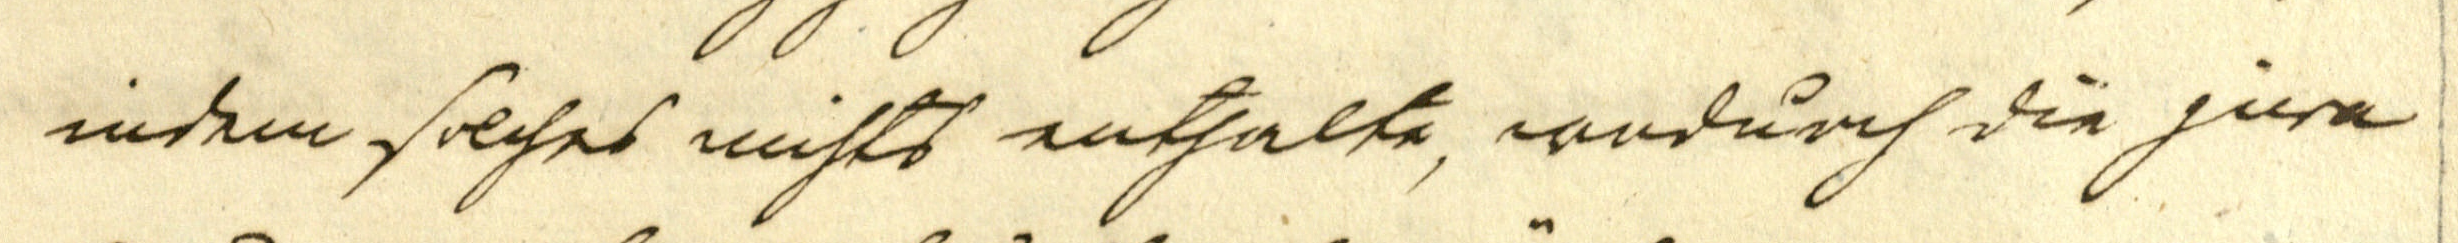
indem solches nichts enthalte, wodurch die jura
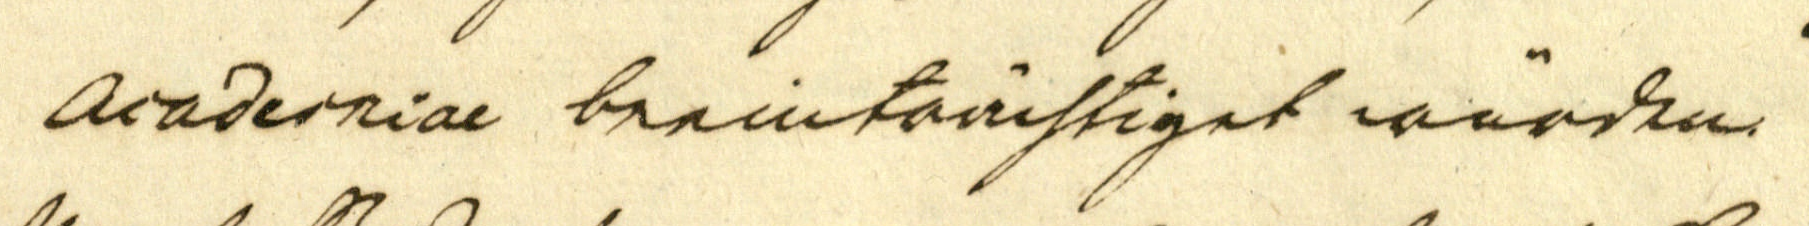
Academiae beeinträchtiget würden.
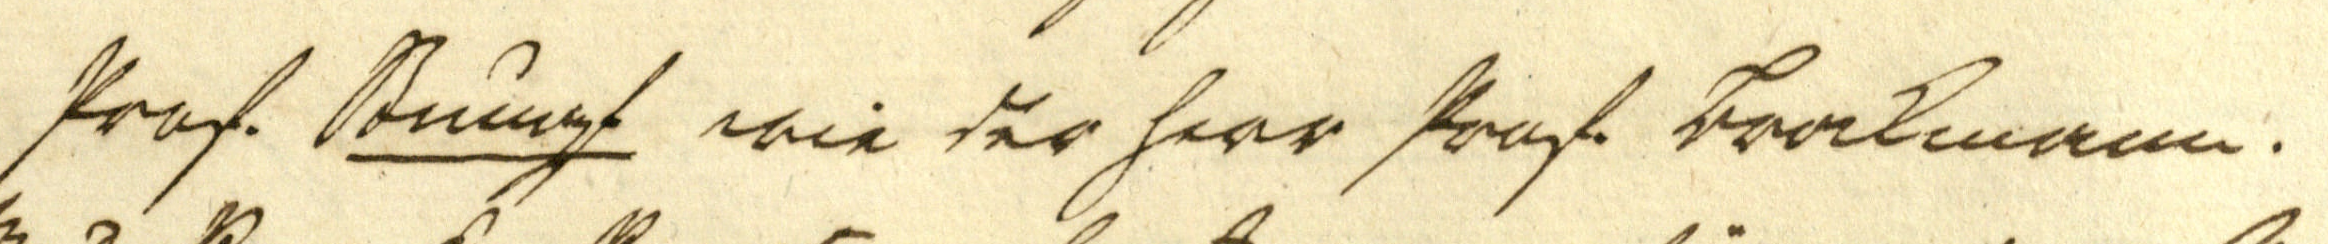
Prof. Stumpf wie der Herr Prof. Brockmann.
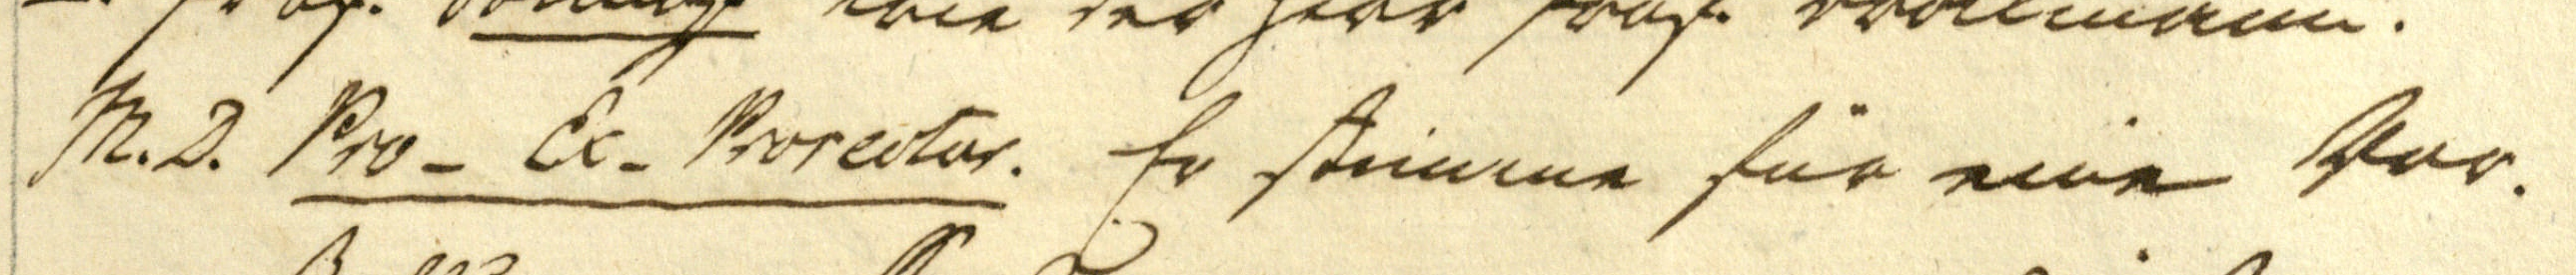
M. D. Pro. Ex. Prorector. Er stimme für eine Vor¬
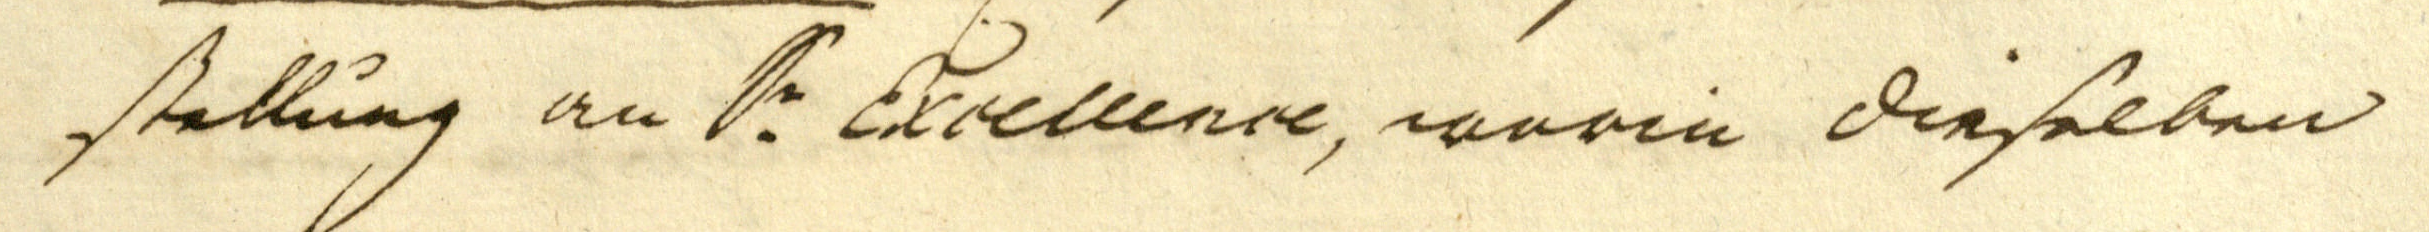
stellung an Sr Excellence, worin dieselben
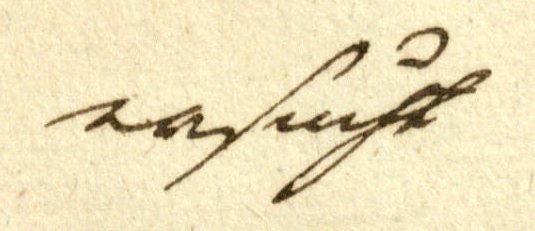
ersucht
